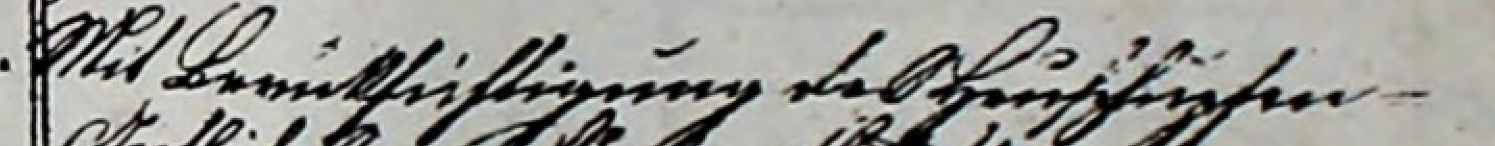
Mit Berücksichtigung des Hauschupsen -
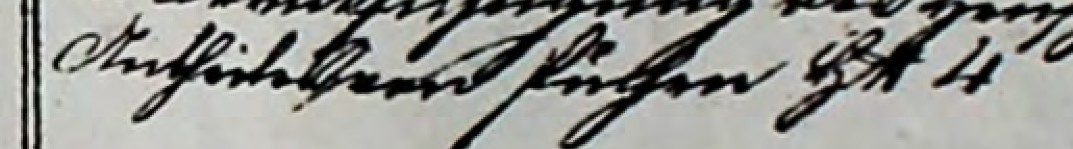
Antheiles Puchen H? 4
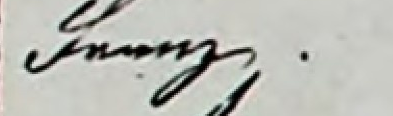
Franz
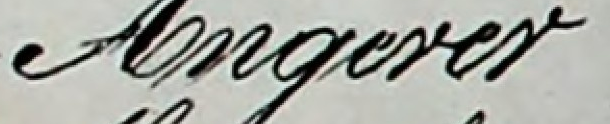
Angerer
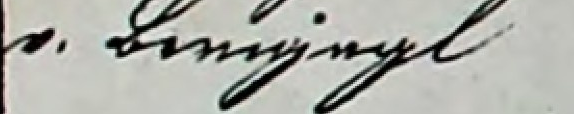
v. Benigegl
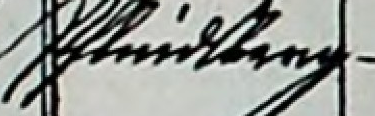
Pflindsberg
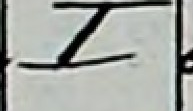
I
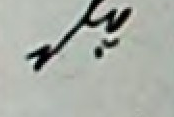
do
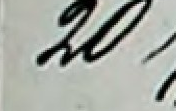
20
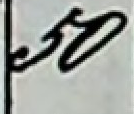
50
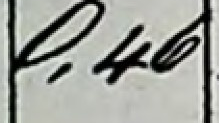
0,46
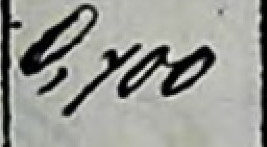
0,700
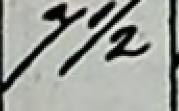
7 1/2
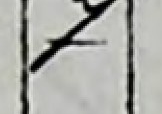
7
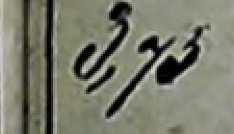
3,75
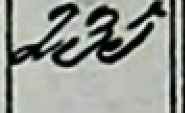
235
